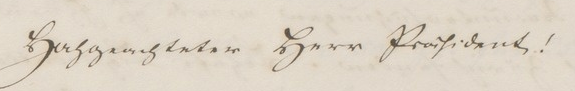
Hochgeachteter Herr Präsident!
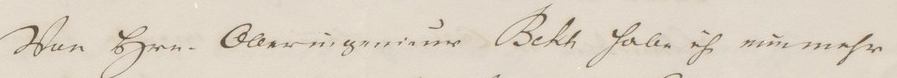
Von Hrn. Oberingenieur Bekh habe ich nunmehr
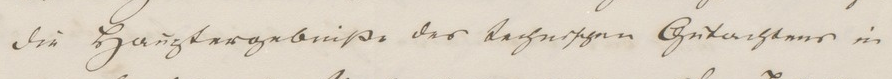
die Hauptergebniße des technischen Gutachtens in
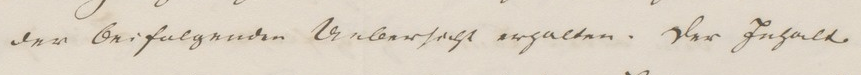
der beifolgenden Uebersicht erhalten. Der Inhalt
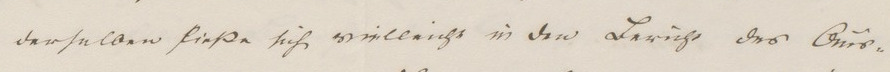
derselben ließe sich vielleicht in den Bericht des Aus-
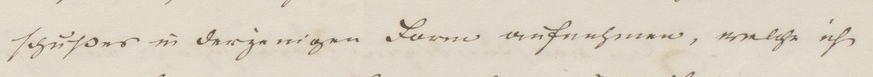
schußes in derjenigen Form aufnehmen, welche ich
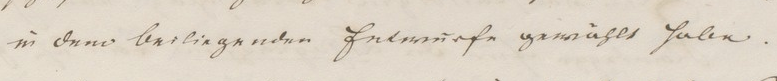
in dem beiliegenden Entwurfe gewählt habe.
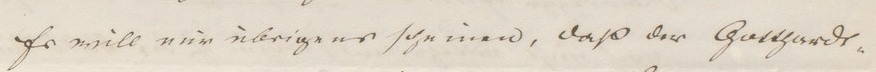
Es will nun übrigens scheinen, daß der Gotthardt -
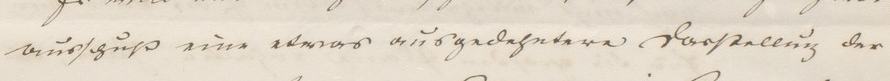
ausschuß eine etwas ausgedehntere Darstellung der
